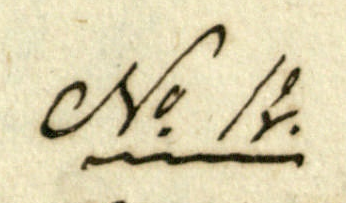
No 12.
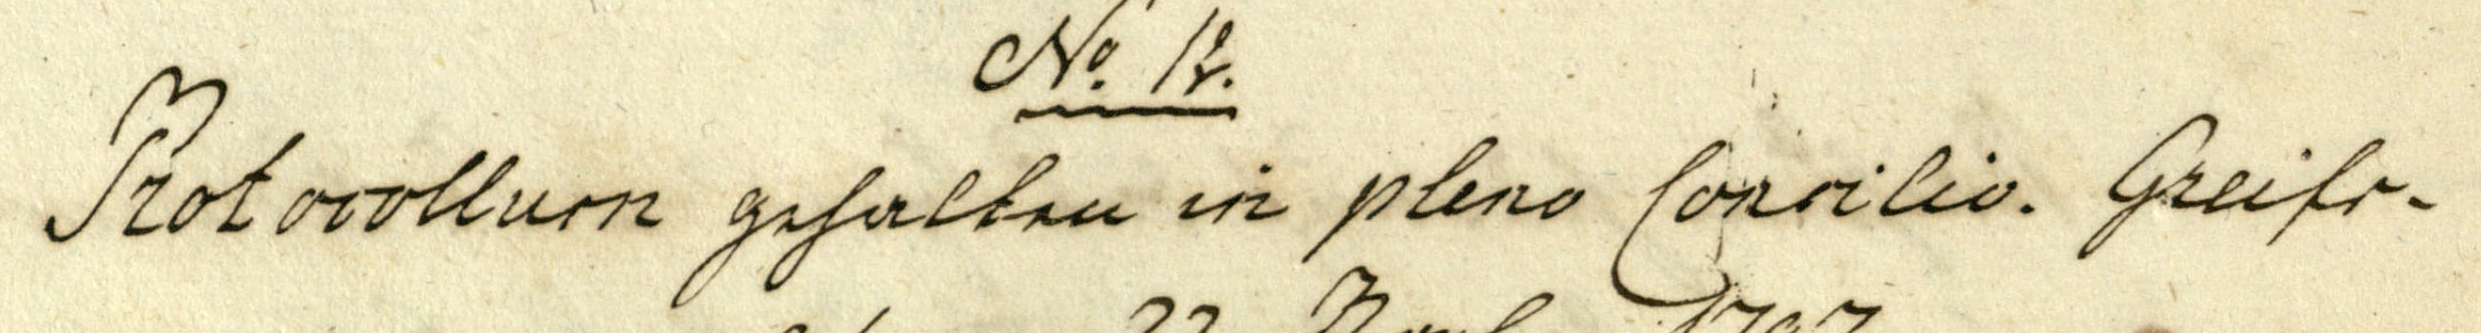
Protocollum gehalten in pleno Concilio. Greifs-
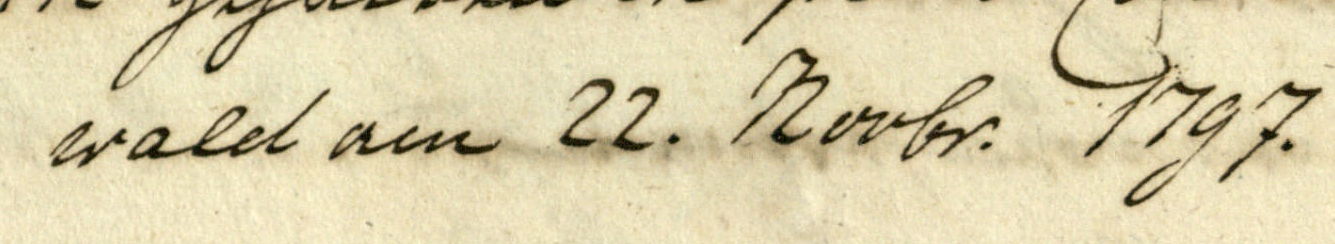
wald am 22. Novbr. 1797.
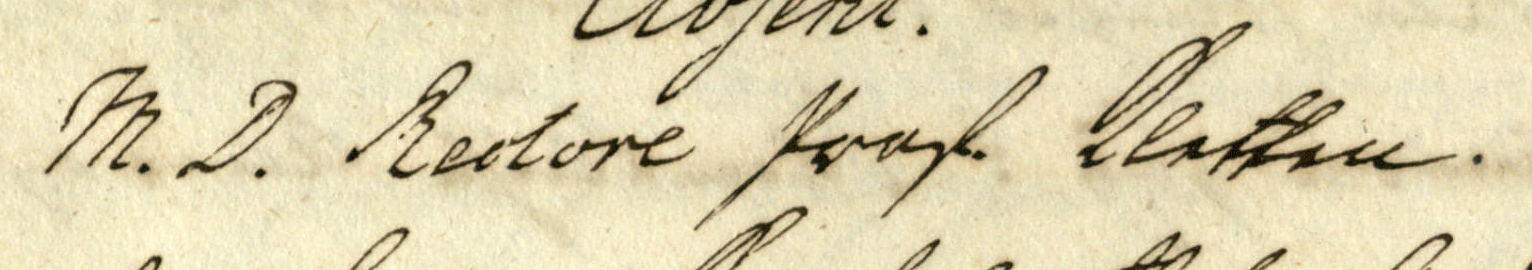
M. D. Rectore Prof. Kletten.
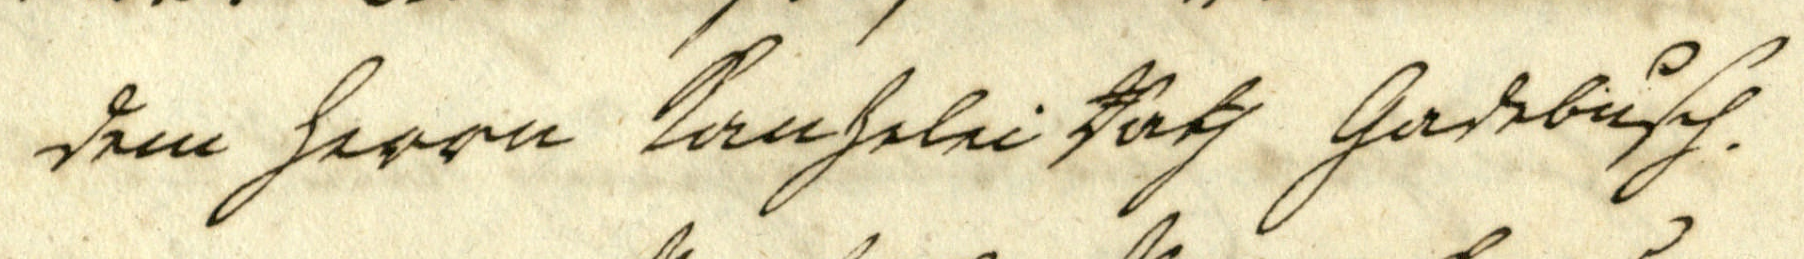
dem Herrn Kanzelei Rath Gadebusch.
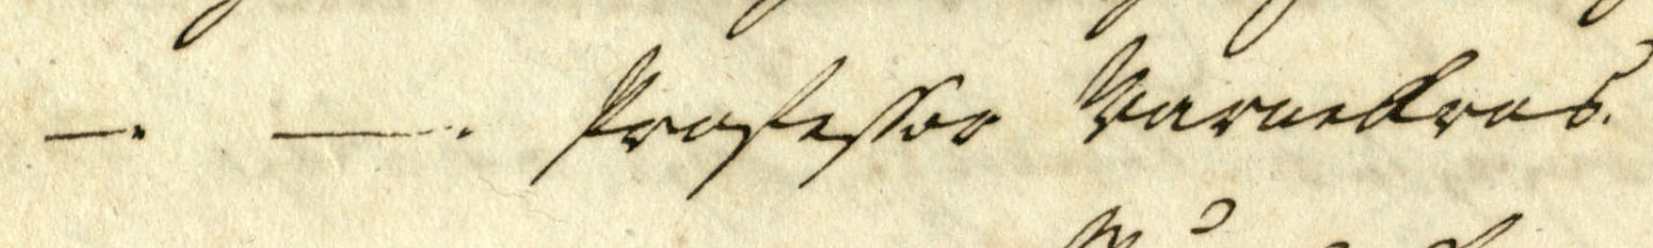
Professor Warnekros
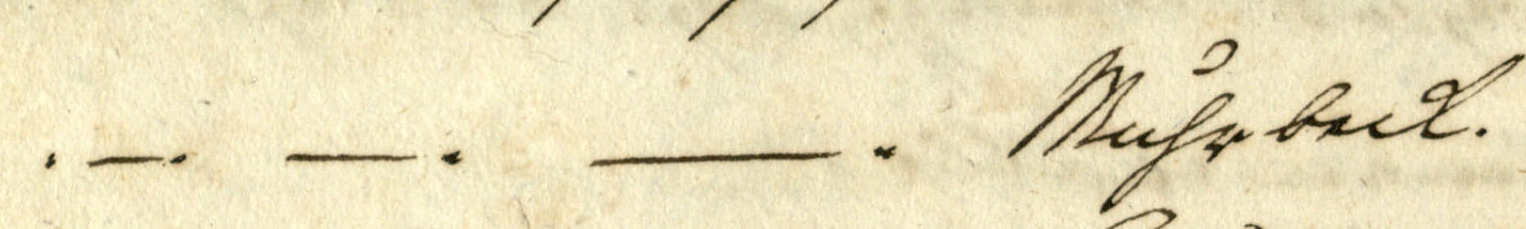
Muhrbeck.
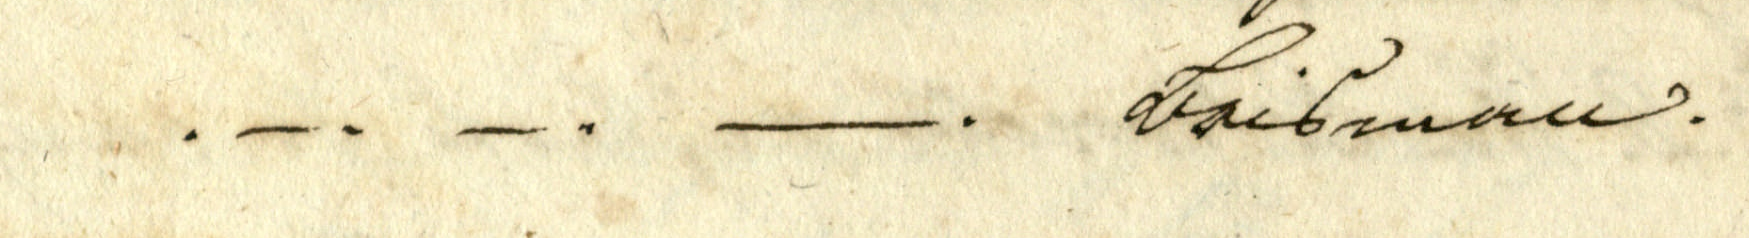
Brisman.
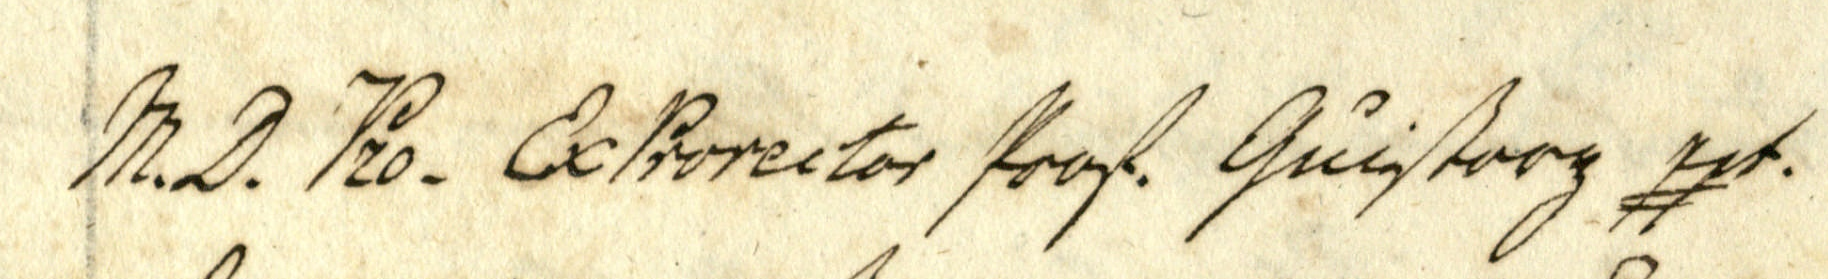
M. D. Pro. ExProrector Prof. Quistorp ppt.
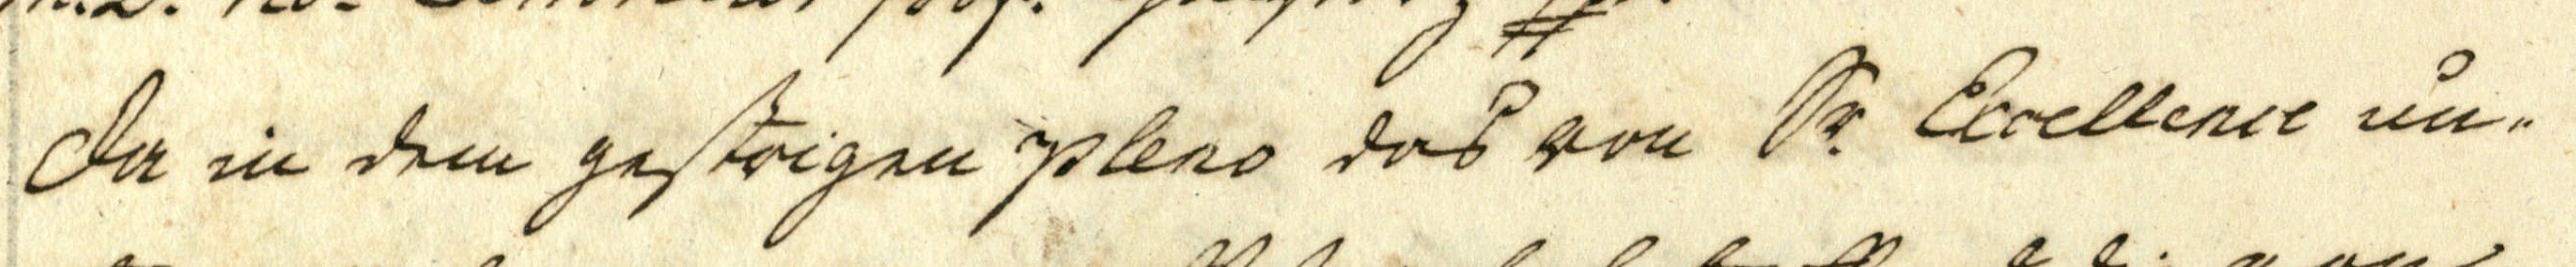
Da in dem gestrigen pleno das von Sr. Excellence un¬
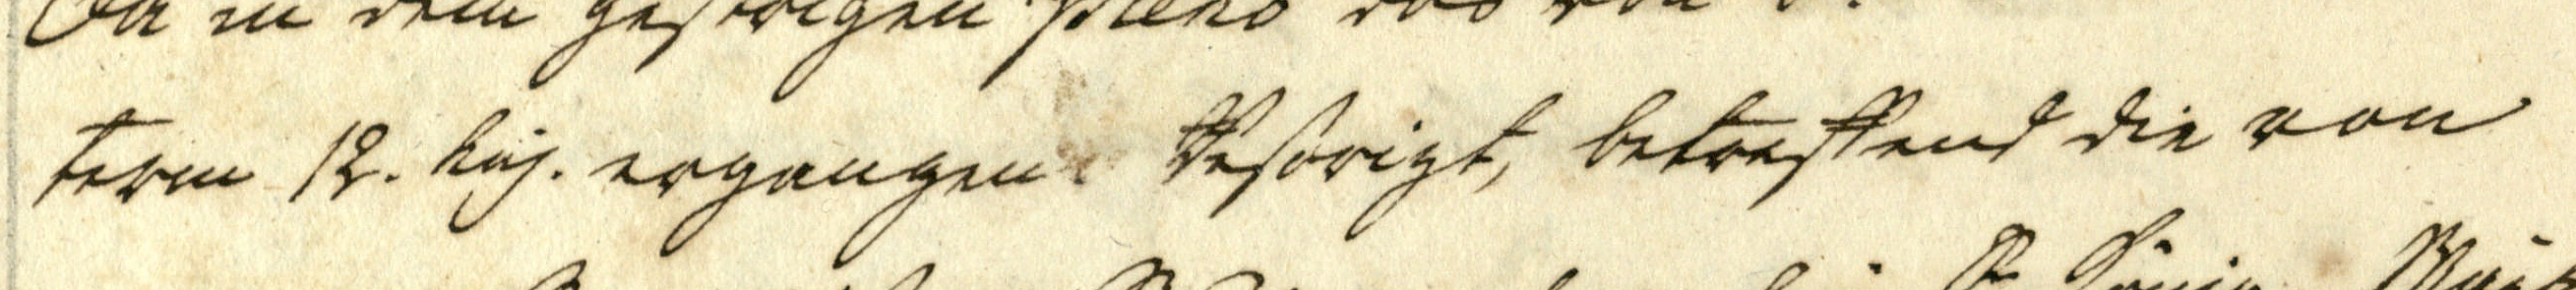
term 12. huj. ergangene. Rescrigt, betreffend die von
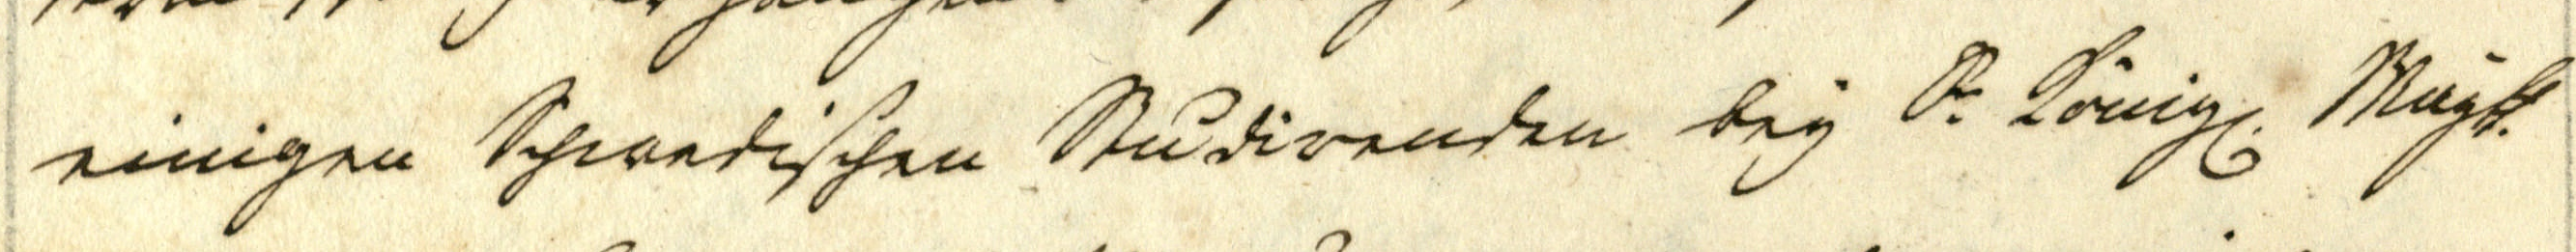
einigen Schwedischen Studirenden beÿ Sr. Königl. Maÿtt.
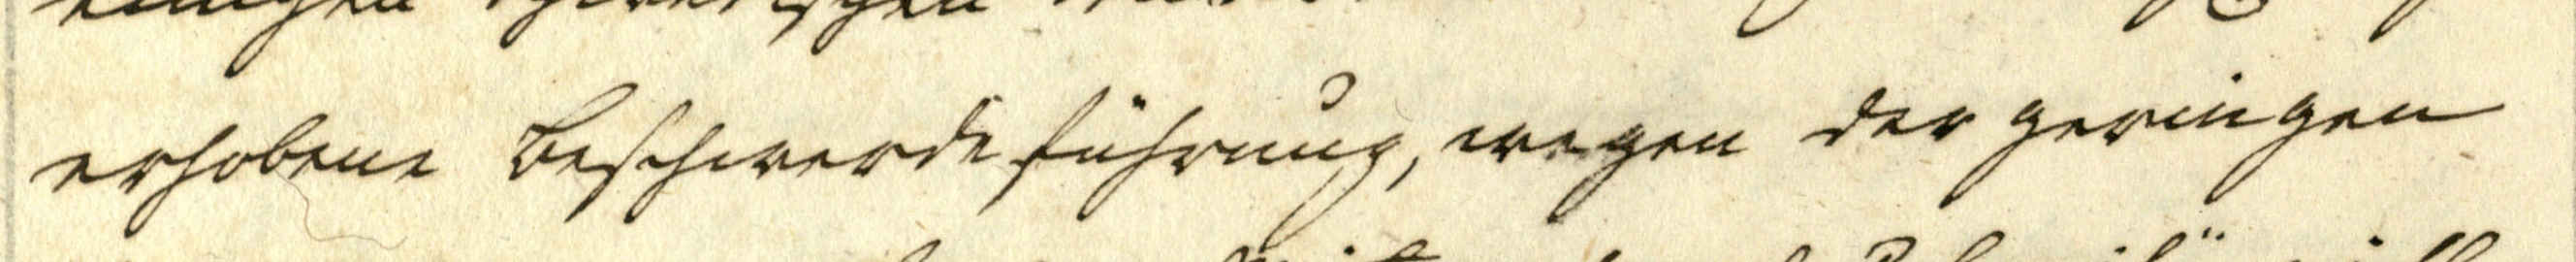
erhobene Beschwerde führung, wegen der geringen
